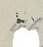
Bern
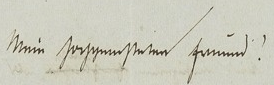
Mein hochgeachteter Freund!
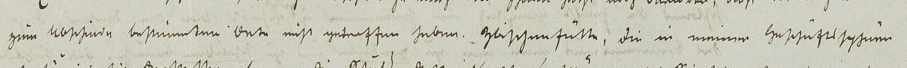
zum Abschiede bestimmten Orte nicht getroffen haben. Zwischenfälle, die in meiner Geschäftssphäre
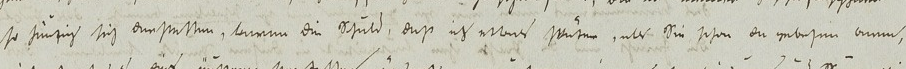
so häufig sich darstellen, waren die Schuld, daß ich etwas später, als Sie schon da gewesen waren,
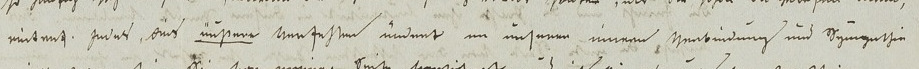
eintraf. Indes, dies äußere Verfehlen ändert an unserer inneren Verbindung und Sympathie
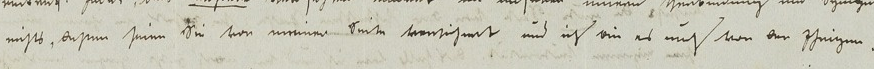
nichts, deßen seien Sie von meiner Seite versichert und ich bin es auch von der Ihrigen.
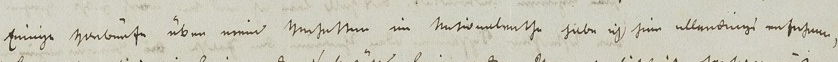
Einige Vorwürfe über mein Verhalten im Nationalrathe habe ich hier allerdings erfahren,
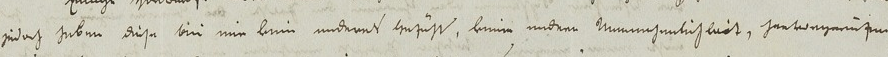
jedoch haben diese bei mir kein anderes Gefühl, keine andere Unannehmlichkeit, hervorgerufen,
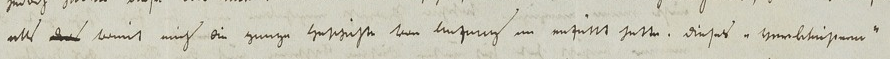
als das womit mich die ganze Geschichte von Anfang an erfüllt hatte. Dieses «Verkleistern»
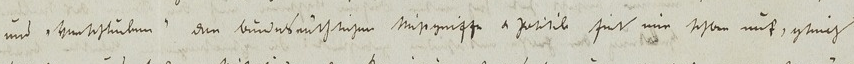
und «Verschlucken» der bundesräthlichen Mißgriffe & Politik fiel mir selber auf, gleich
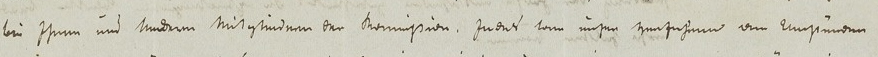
wie Ihnen und anderen Mitgliedern der Kommißion. Indes wenn unser Verfahren den Umständen
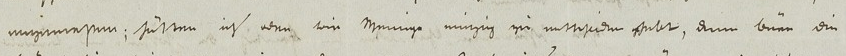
angemeßen, hätten ich oder wir Wenige einzig zu entscheiden gehabt, dann wäre die
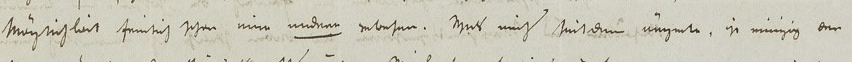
Möglichkeit freilich schon eine andere gewesen. Was mich seitdem ärgerte, ist einzig der
